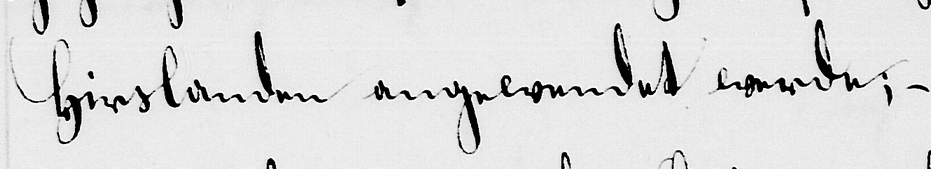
Hirslanden angewendet werde;
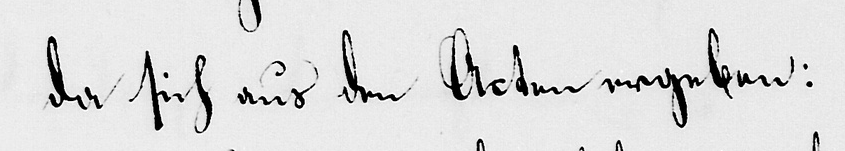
da sich aus den Acten ergeben:
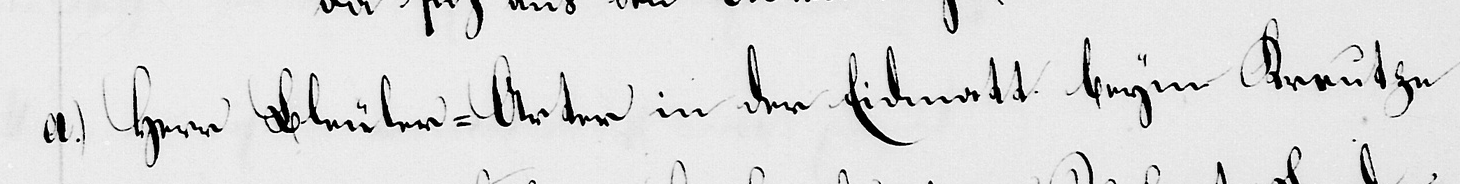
a.)Herr Bleuler-Arter in der Eidmatt beym Kreutze
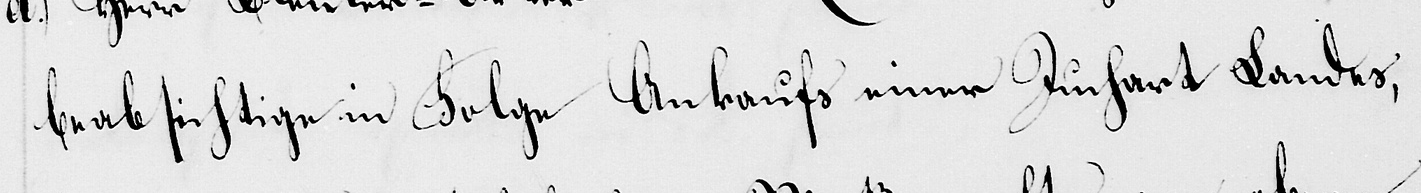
beabsichtige in Folge Ankaufs einer Juchart Landes,
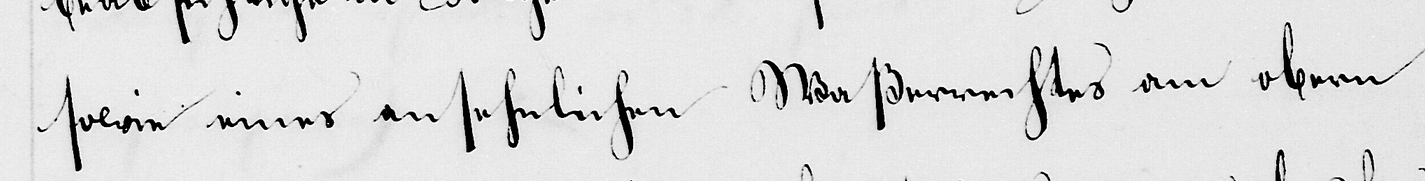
sowie eines ansehnlichen Waßerrechtes am obern
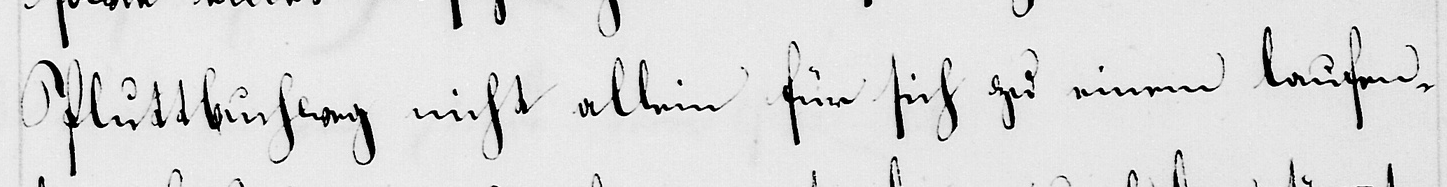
Pluttbuchweg nicht allein für sich zu einem laufen¬
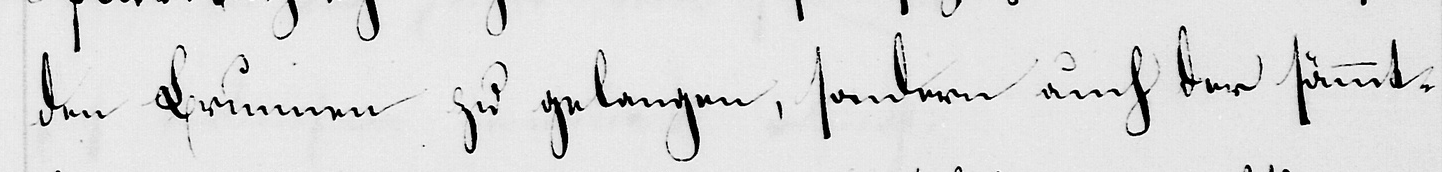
den Brunnen zu gelangen, sondern auch der sämmt¬
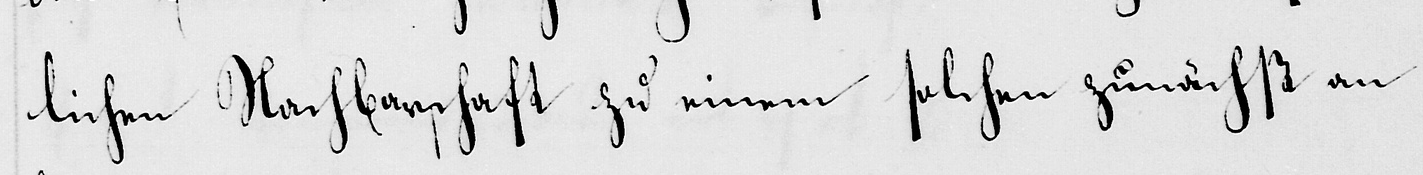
lichen Nachbarschaft zu einem solchen zunächst an
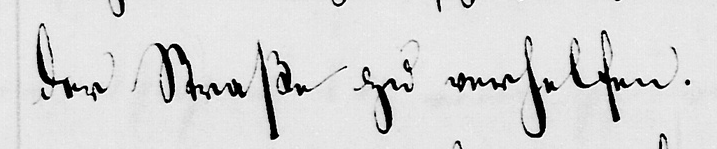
der Straße zu verhelfen.
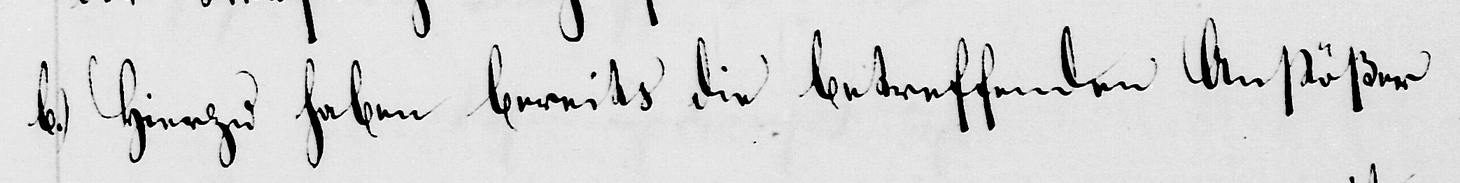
b.) Hierzu haben bereits die betreffenden Anstößer
